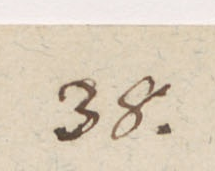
38.
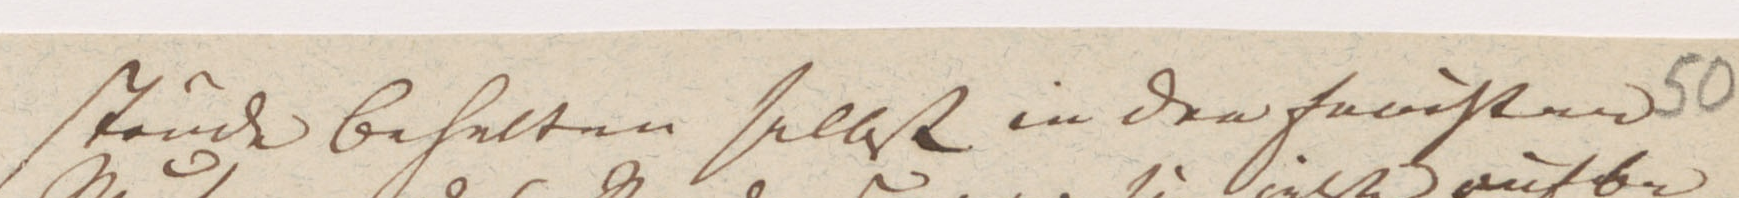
stände behalten selbst in den feuchten
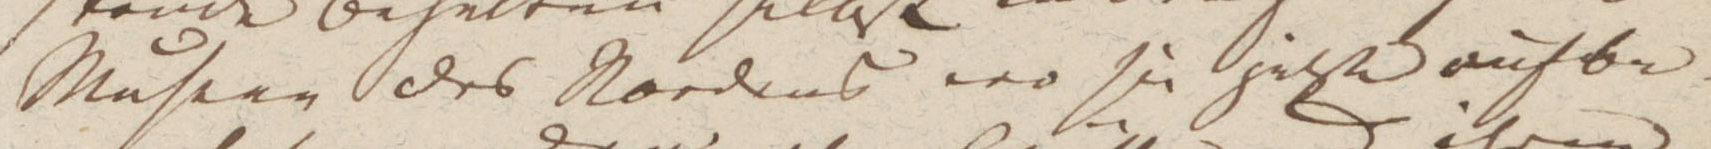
Museen des Nordens wo sie jetzt aufbe-
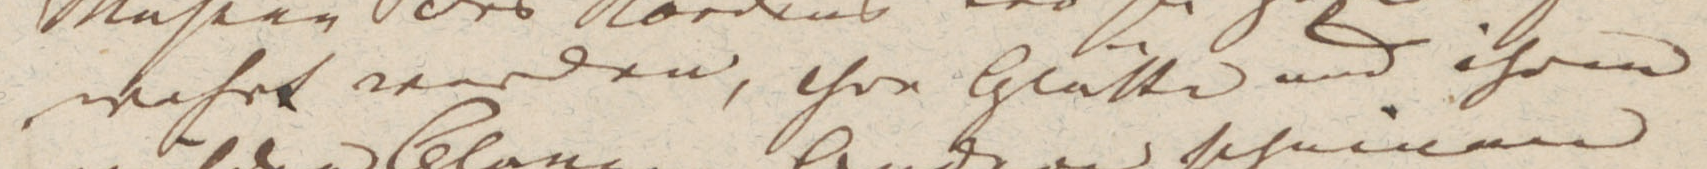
wahrt werden, ihre Glätte und ihren
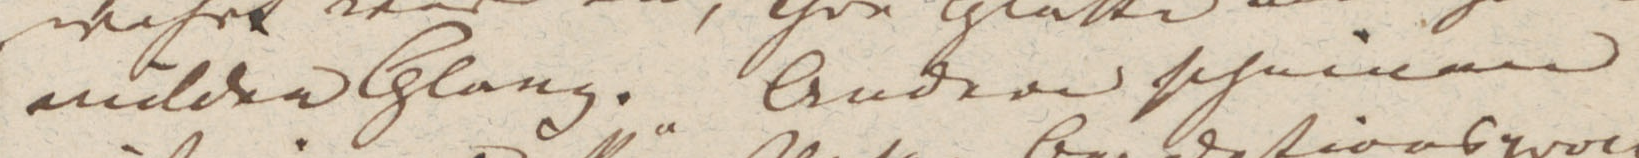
milden Glanz. Andere scheinen
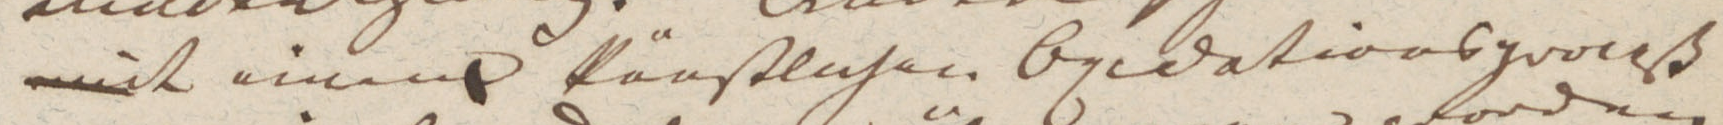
mit einemn künstlichen Oxidationsprocess
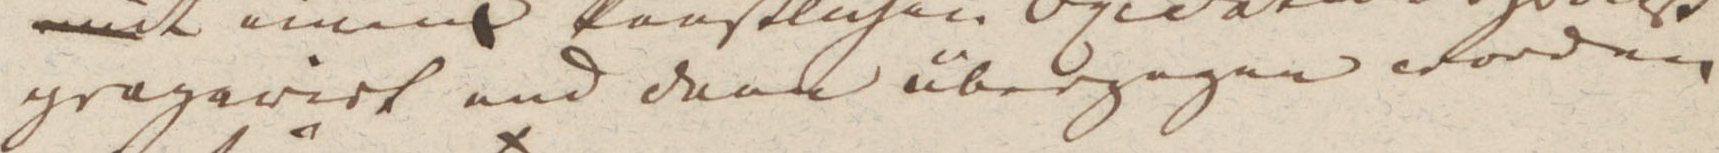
praparirt und dann überzogen worden
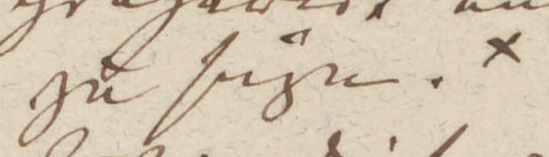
zu seyn. %
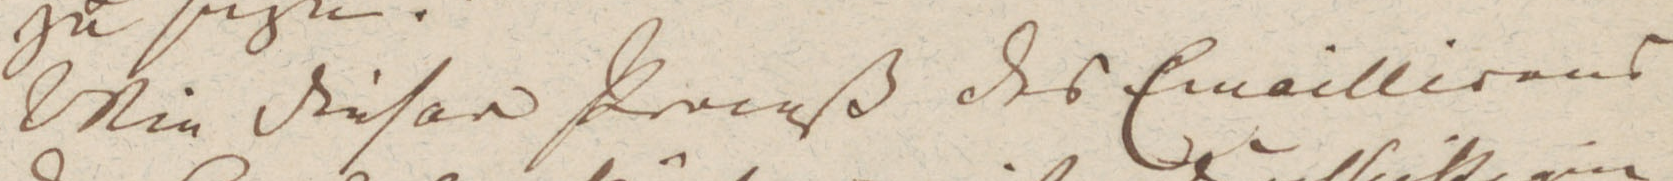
Wie dieser Process des Emaillirens
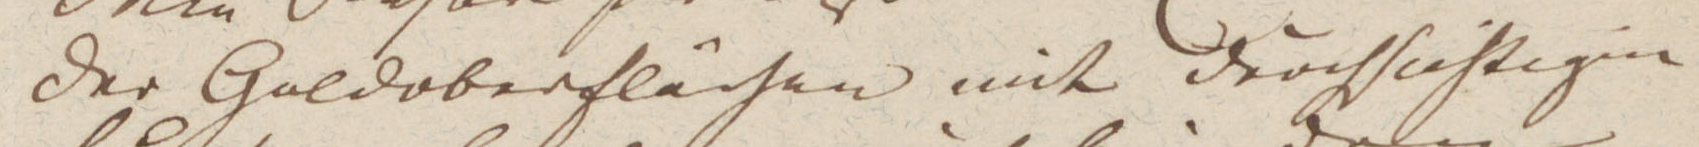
der Goldoberflächen mit durchsichtigen
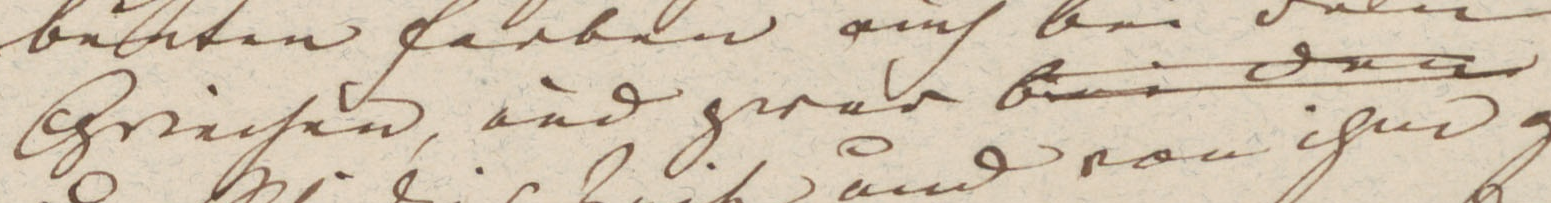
Griechen, und zwar bei den
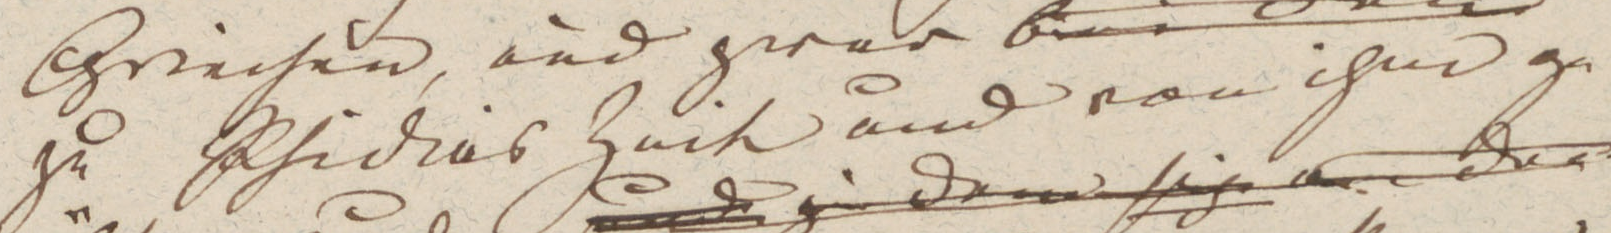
zu Phidias Zeit und von ihm ge-
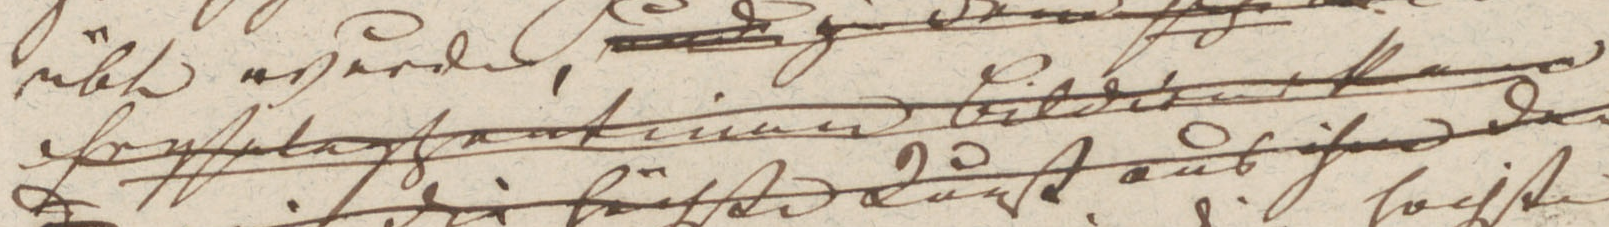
chryselephantinen Bildwerken
